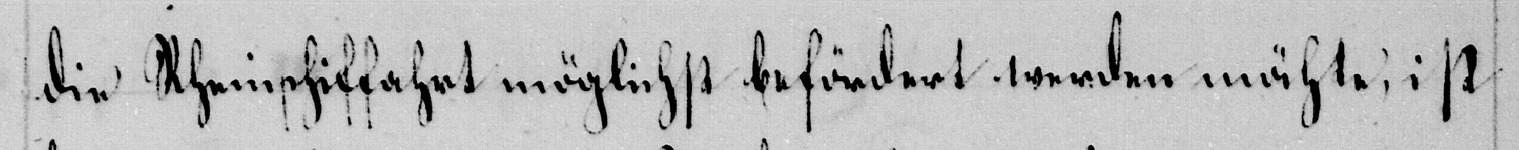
die Rheinschiffahrt möglichst befördert werden möchte, ist
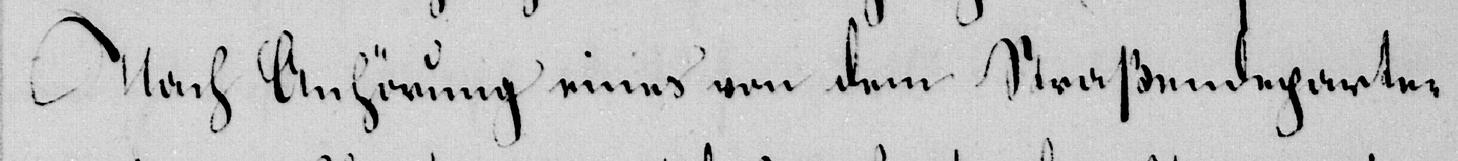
Nach Anhörung eines von dem Sraßendeparte¬
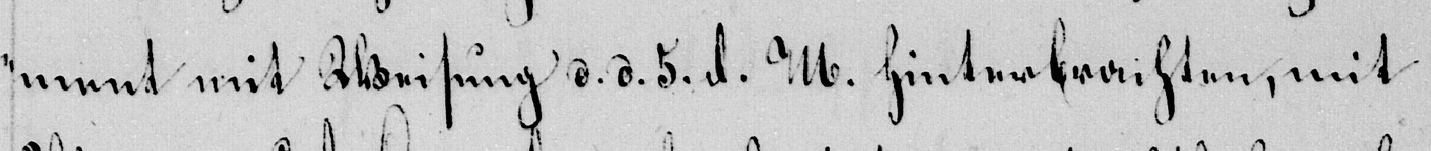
ment mit Weisung d. d. 5. d. M. hinterbrachten, mit
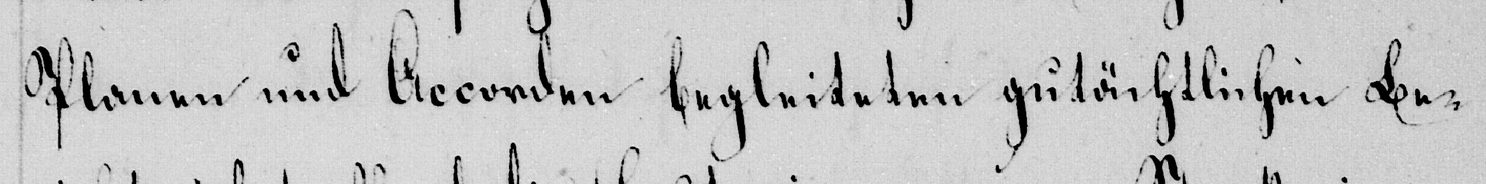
Planen und Accorden begleiteten gutächtlichen Be¬
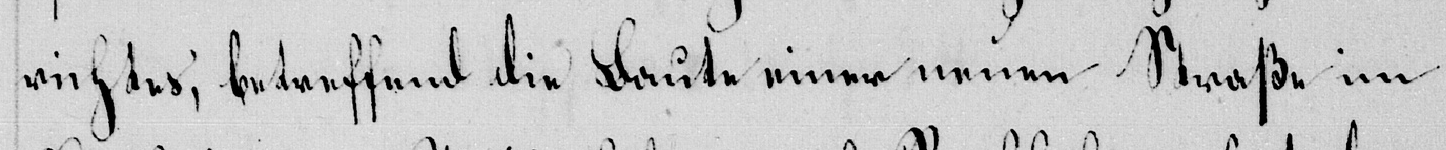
richtes, betreffend die Baute einer neuen Straße im
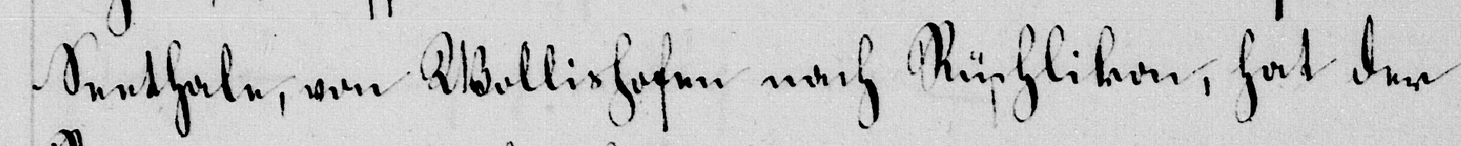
Seethale, von Wollishofen nach Rüschlikon, hat der
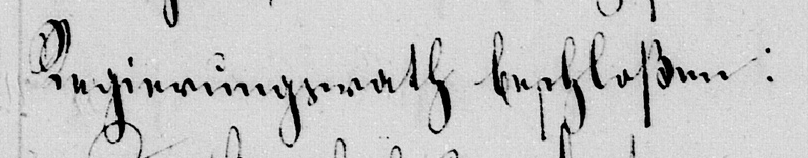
Regierungsrath beschloßen:
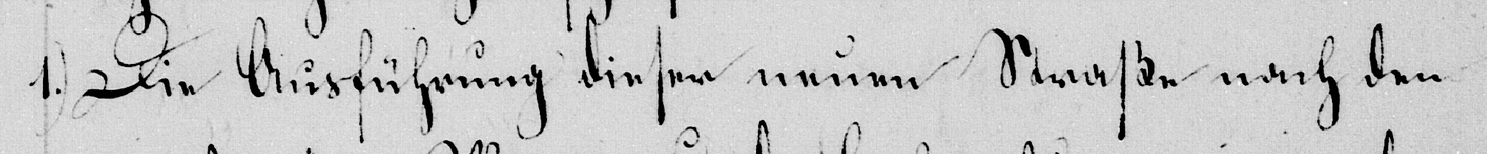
1.) Die Ausführung dieser neuen Straße nach den
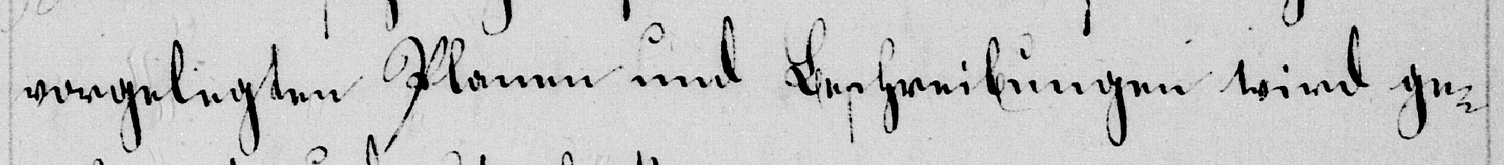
vorgelegten Planen und Beschreibungen wird ge¬
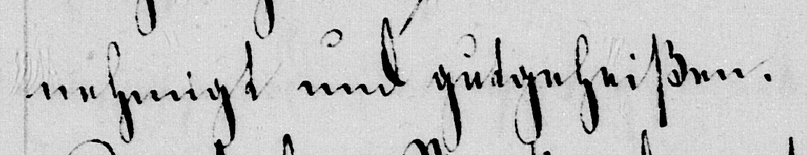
nehmigt und gutgeheißen.
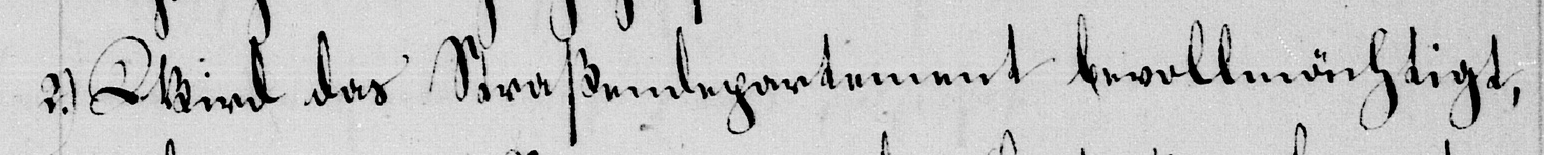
2.) Wird das Straßendepartement bevollmächtigt,
